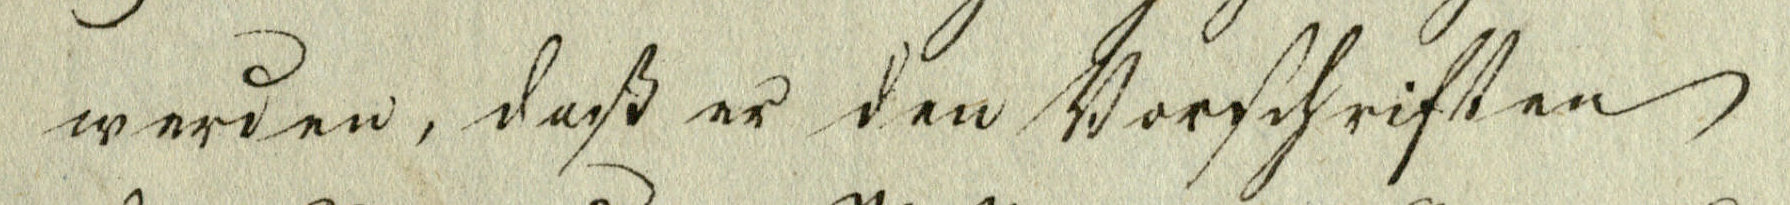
werden, daß er den Vorschriften
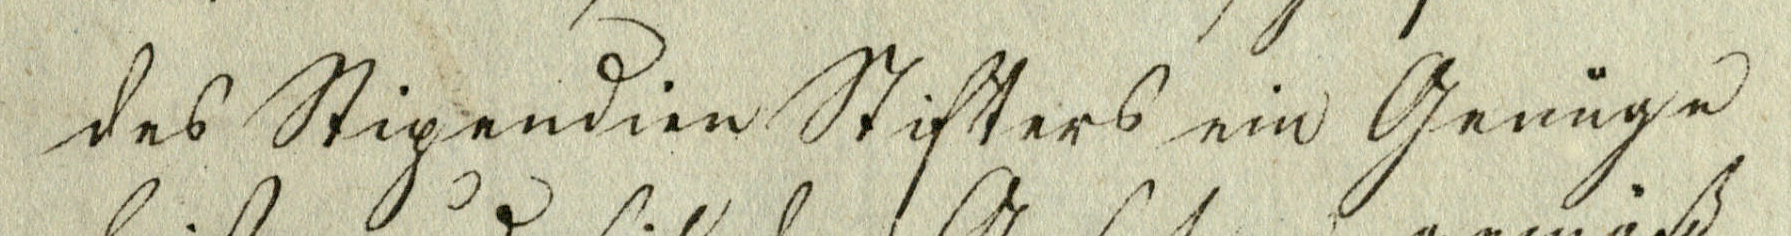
des Stipendien Stifters ein Genüge
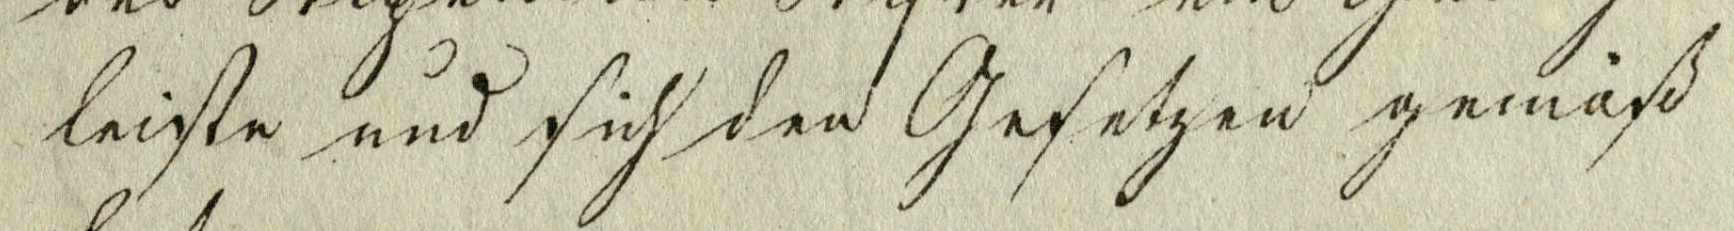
leisten und sich den Gesetzen gemäß
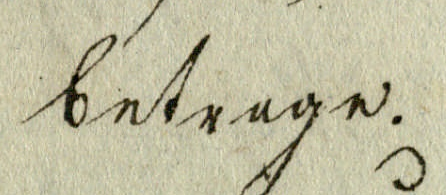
betrage.
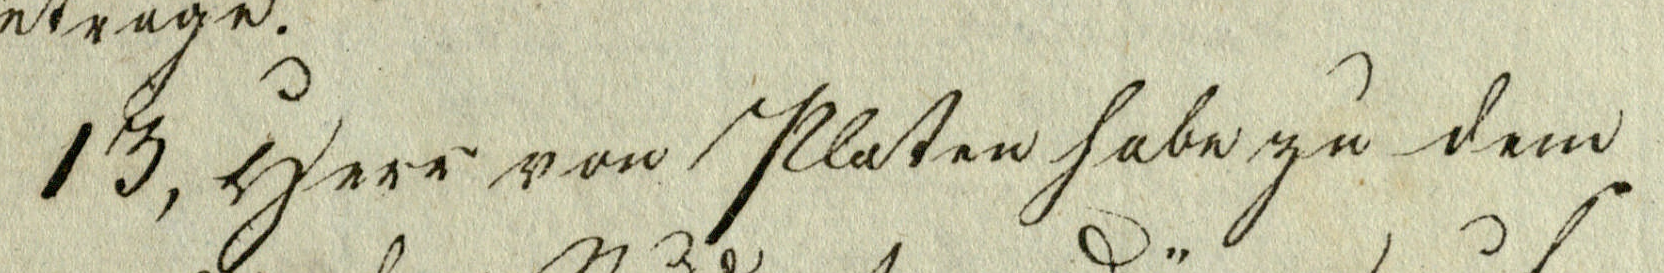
13, Herr von Platen habe zu dem
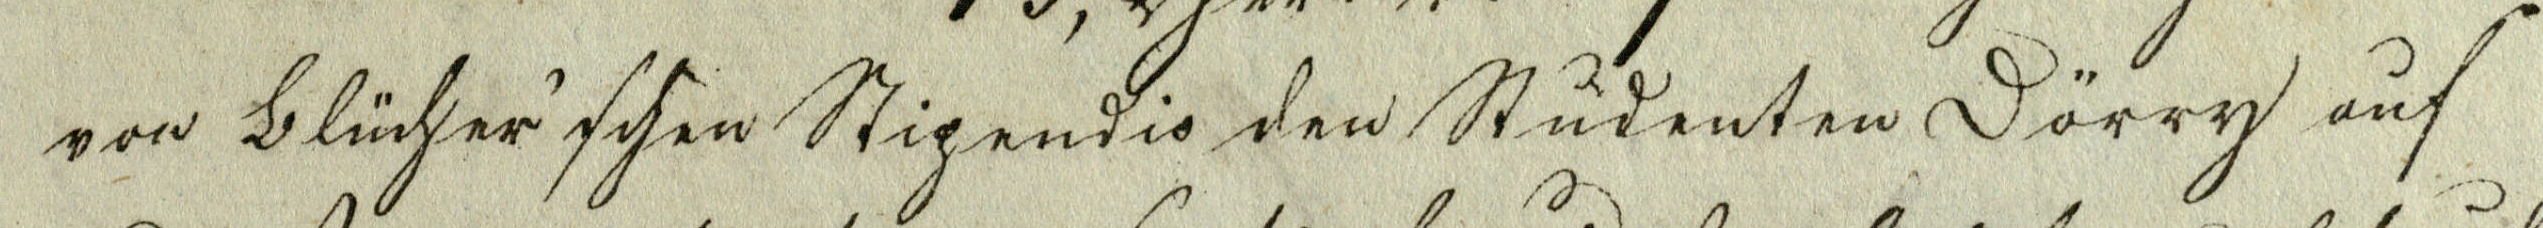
von Blücher'schen Stipendio den Studenten Dörry auf
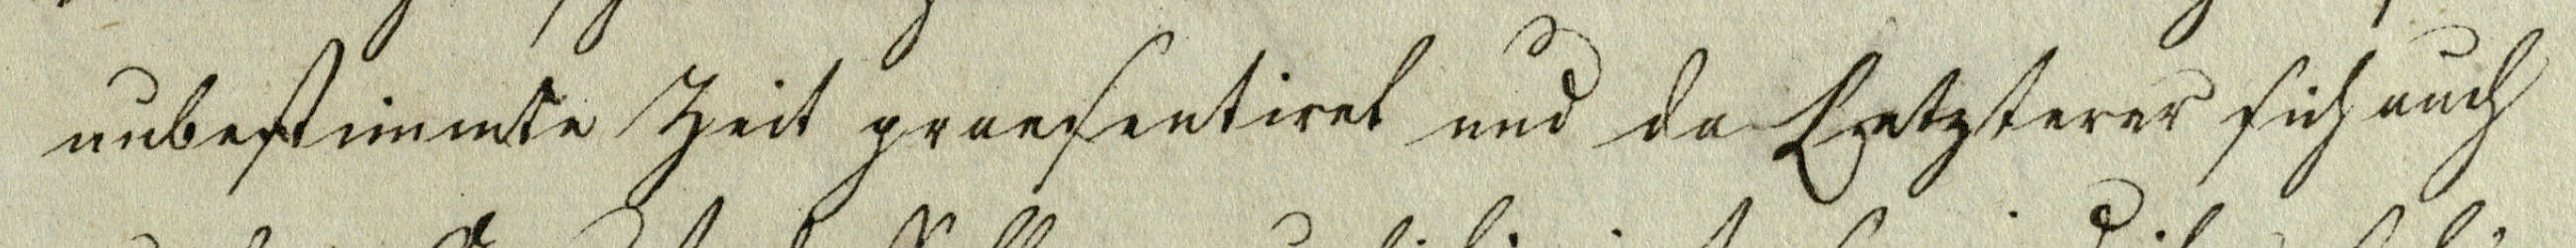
unbestimmte Zeit praesentiret und da Letzterer sich auch
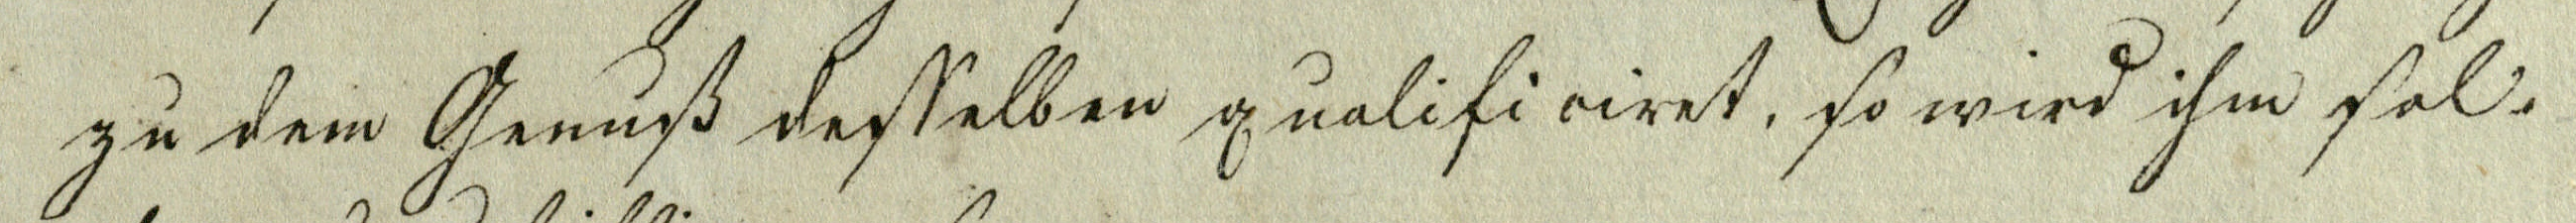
zu dem Genuß desselben qualificiret, so wird ihm sol¬
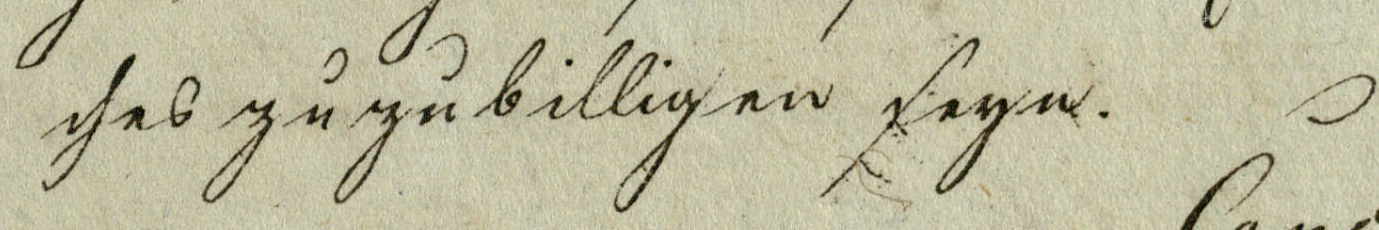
ches zuzubilligen seyn.
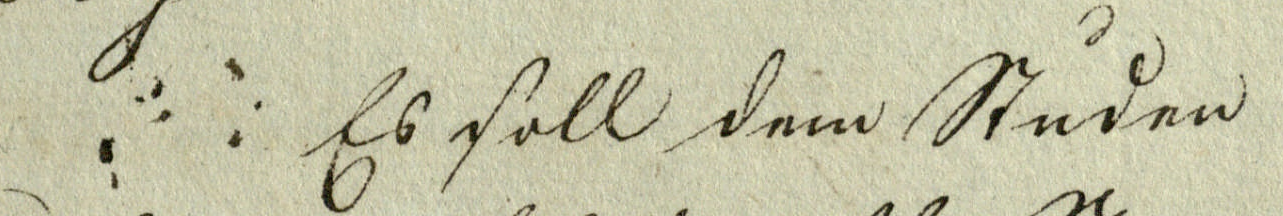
Es soll dem Studen¬
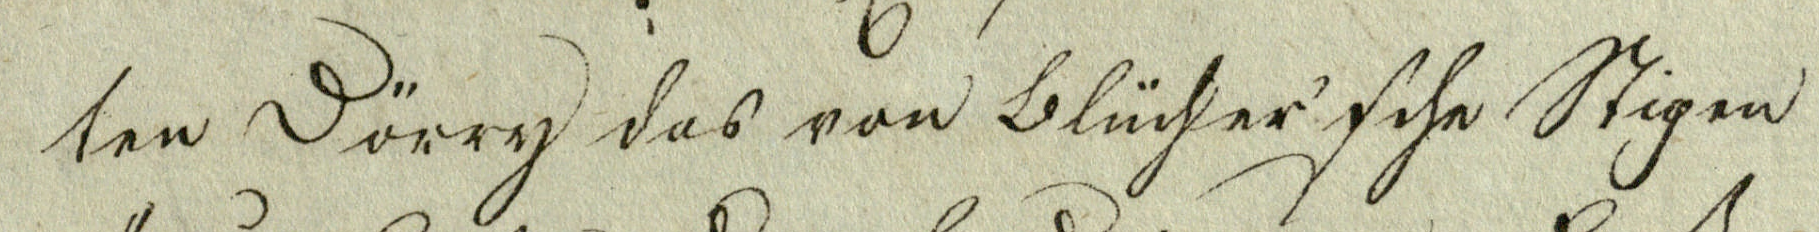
ten Dörry das von Blücher'sche Stipen¬
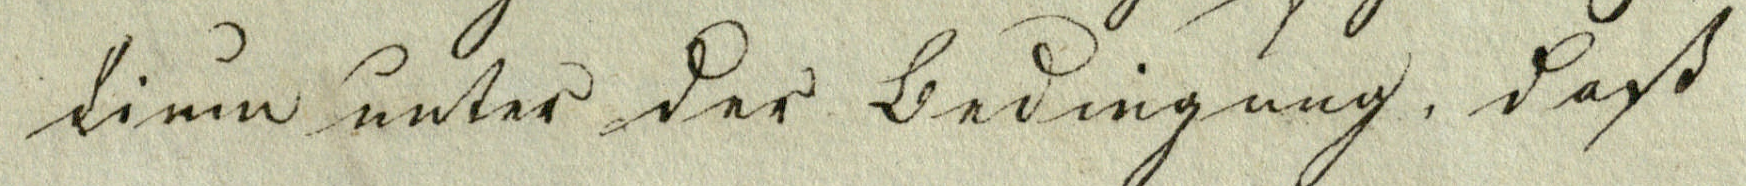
dium unter der Bedingung, daß
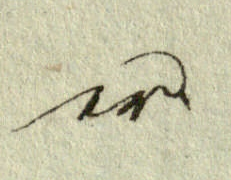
er
